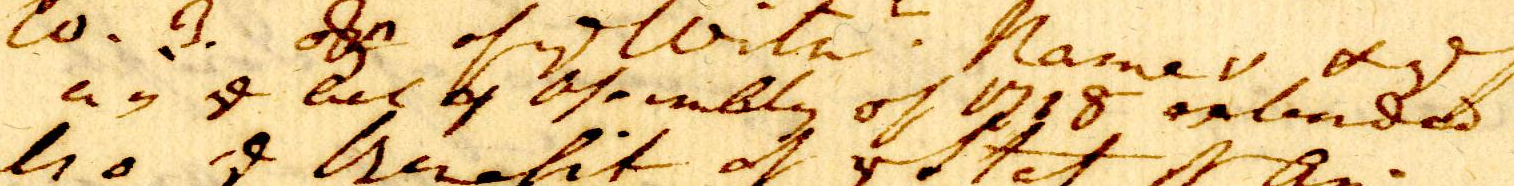a y^e y^e bet of Assembly of 1718 onlanded
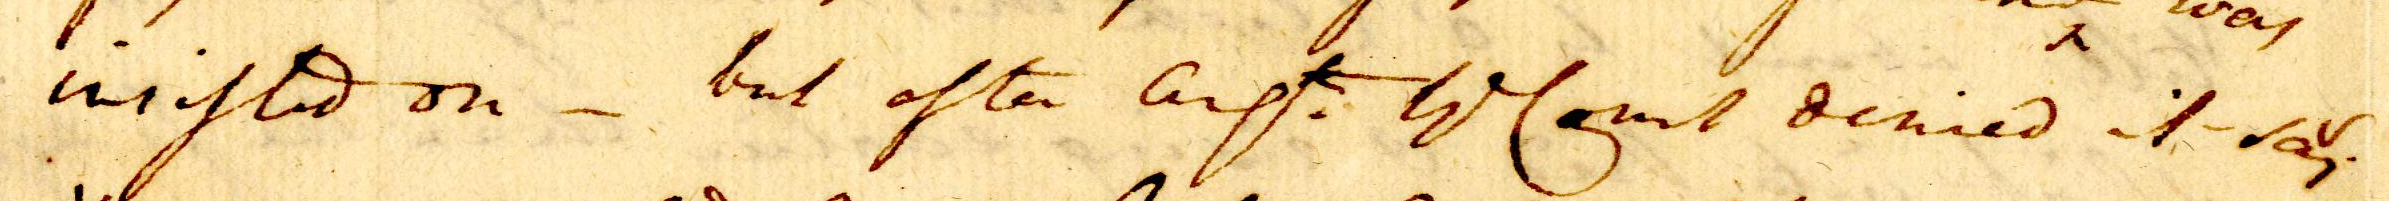insisted on but after Ans^[_] G^e Comb denied it say^g
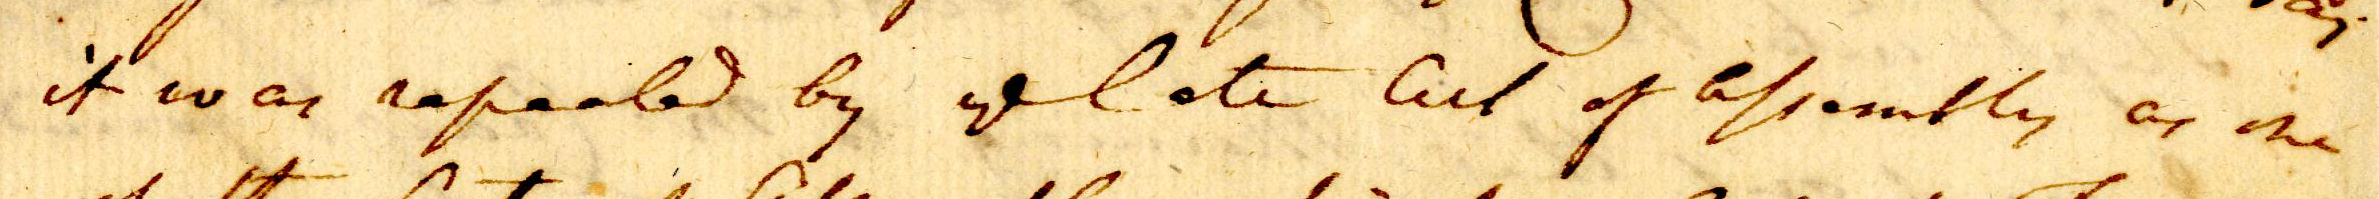if was repealed by y^e late Act of assembly as one
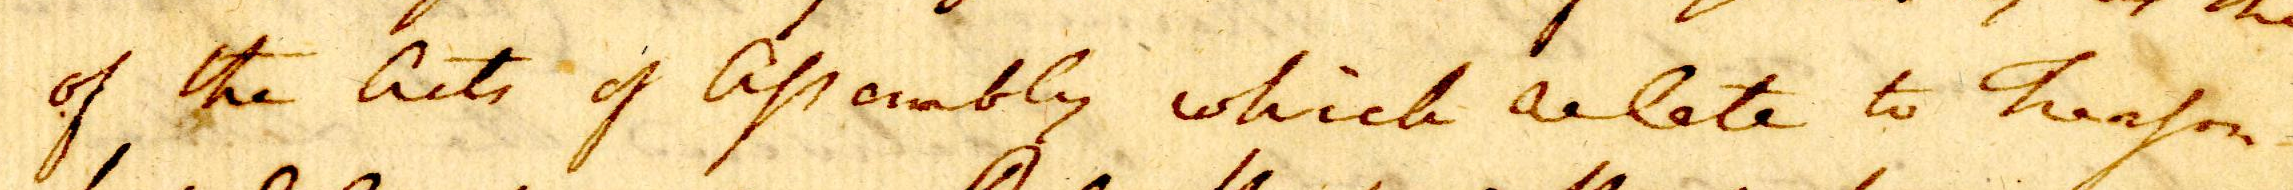of the Acts of Assembly which relate to Treason
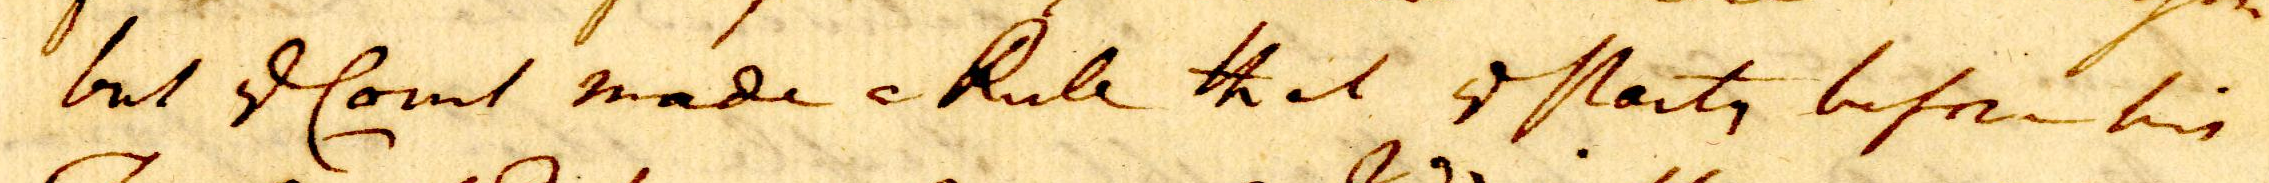but y^e Court made a Rule that y^e Party before his
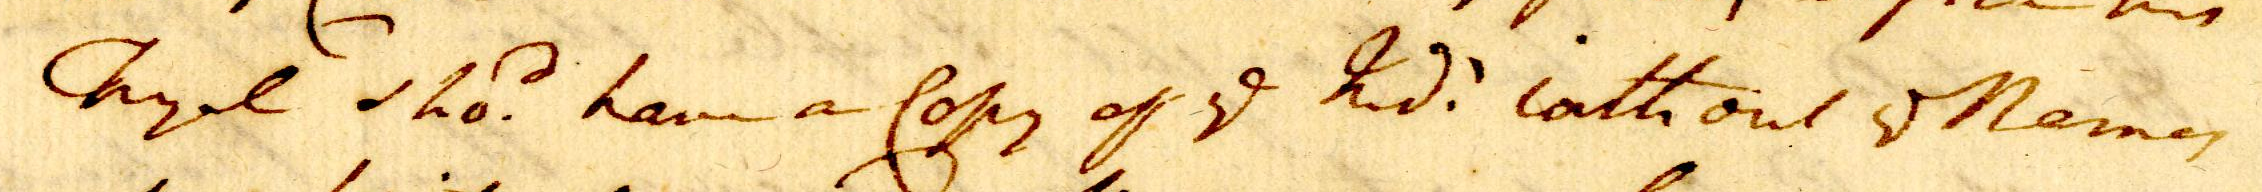Tryal sho^d. have a Copy of y^e Ind: without y^e Names
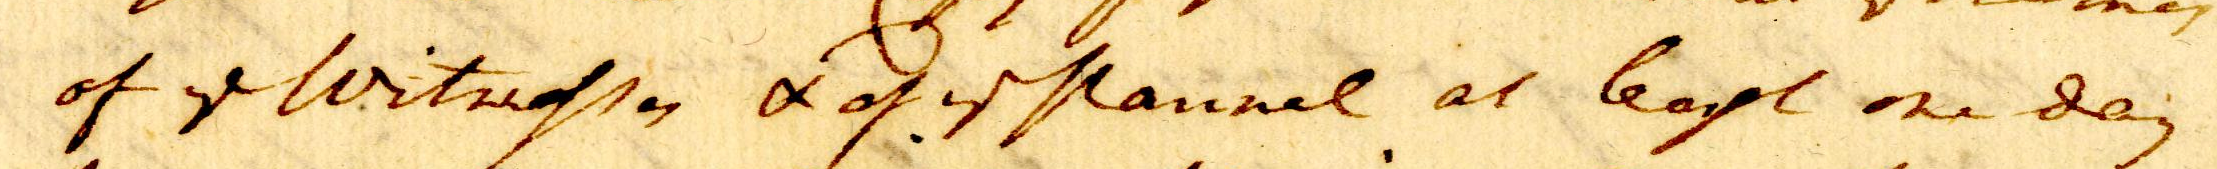of y^e Witness & of y^e Pannel at least one day
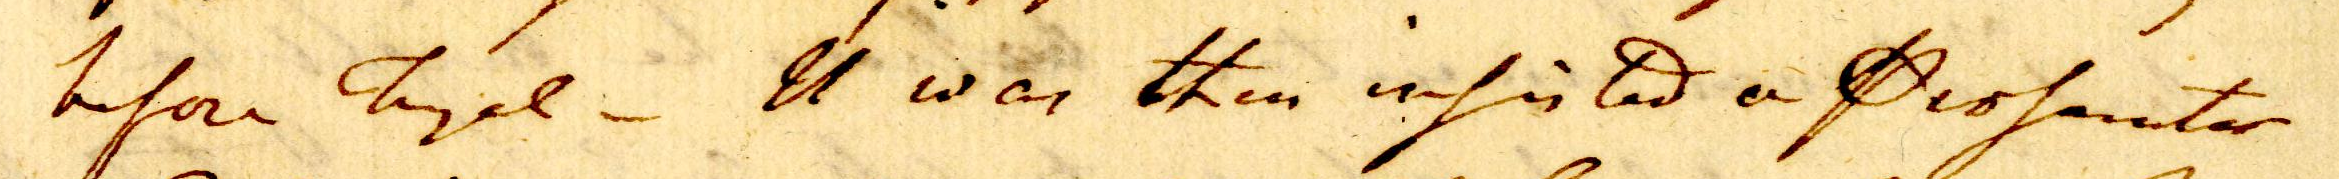before Tryal. lt was then insisted a Prosecutor
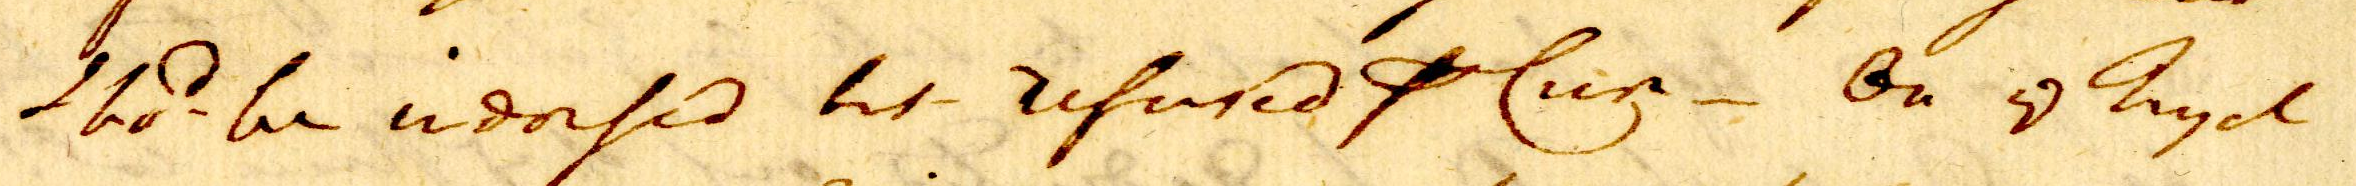sho^d be indorsed but refused per Cur. On y^e Tryal
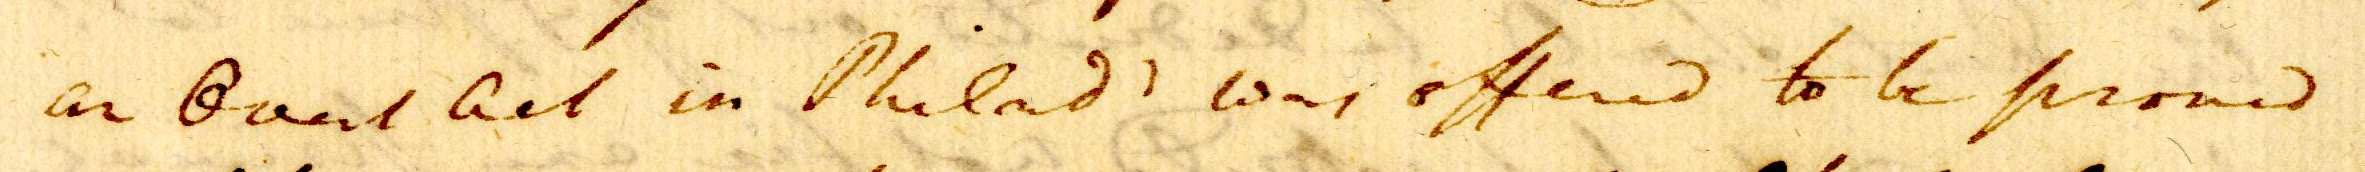an Overt Act in Philad^a. was offered to be proved
